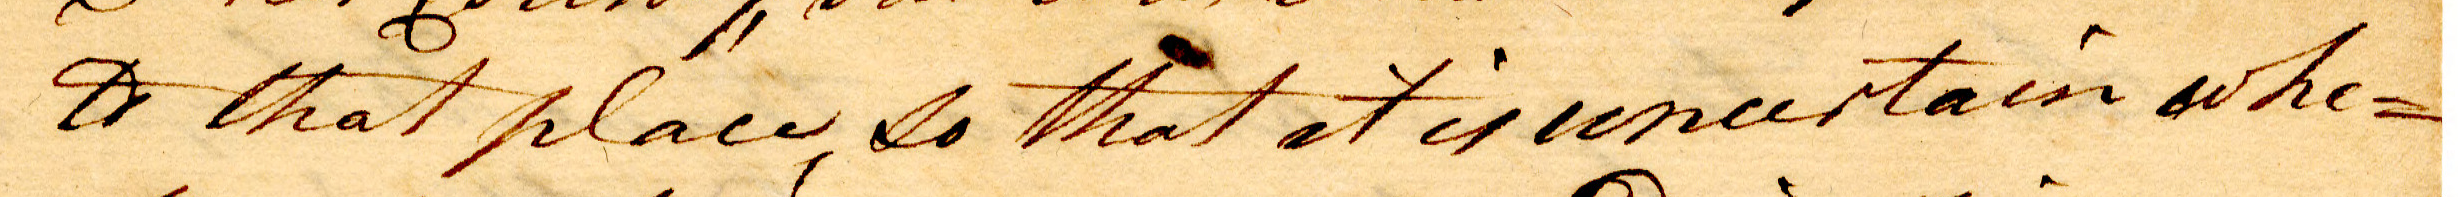to that place, so that it is uncertain whe-
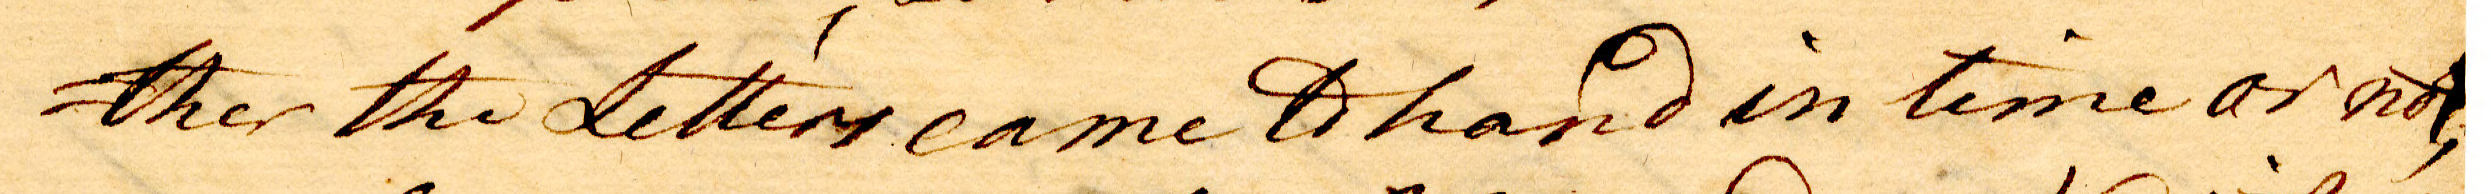-ther the Letters came to hand in time or not,
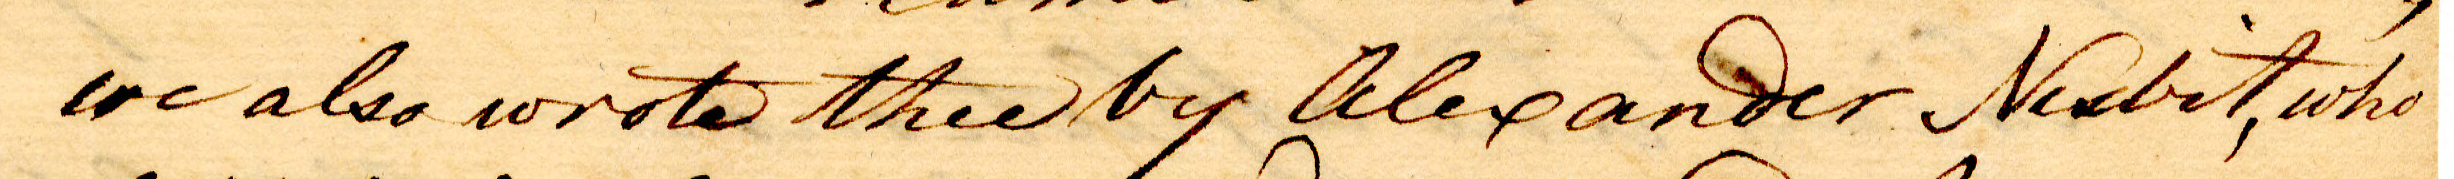we also wrote thee by Alexander Nesbit, who
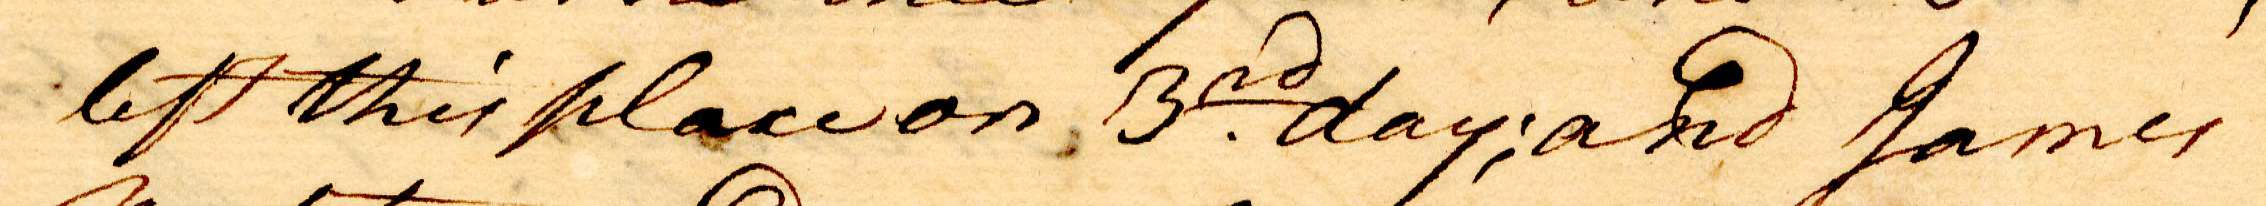left this place on 3^rd. day; and James
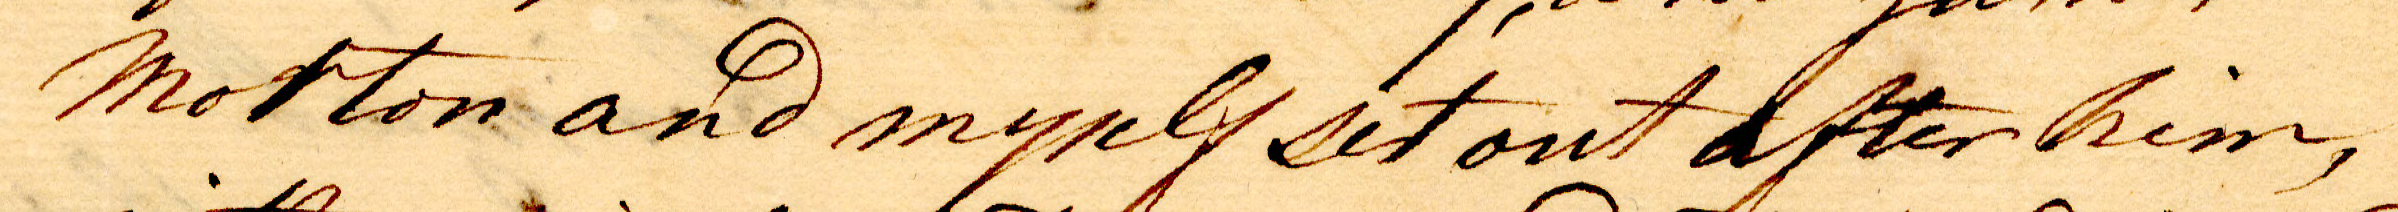Morton and myself set out after him,
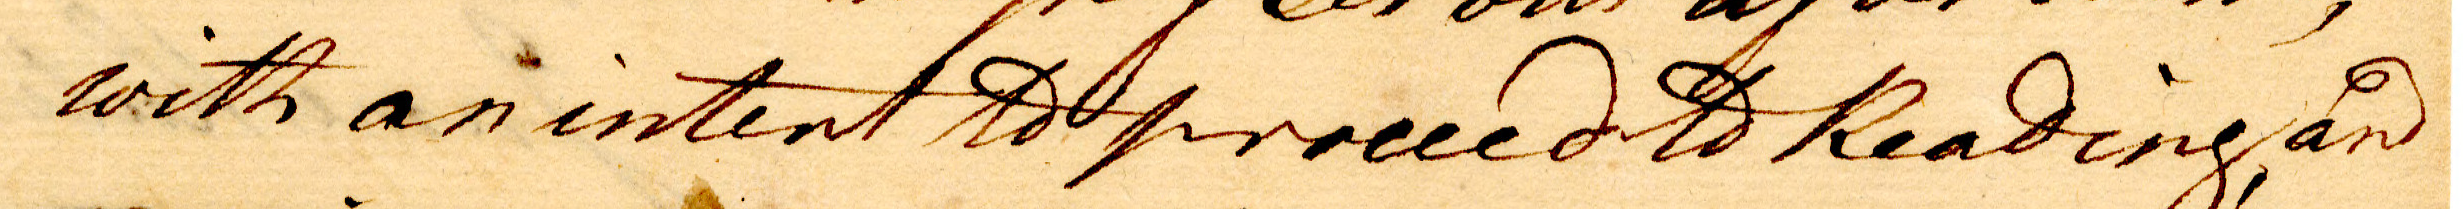with an intent to proceed to Reading, and
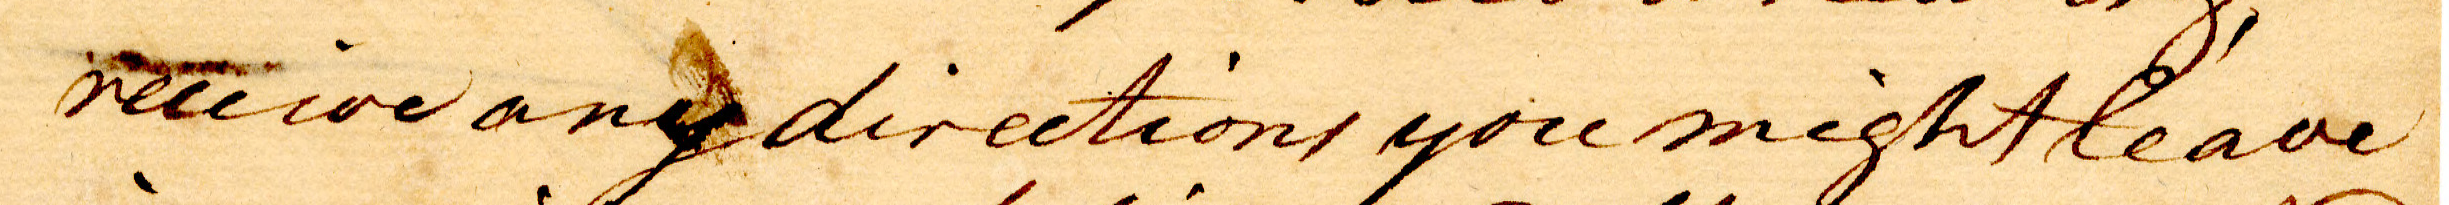receive any directions you might leave
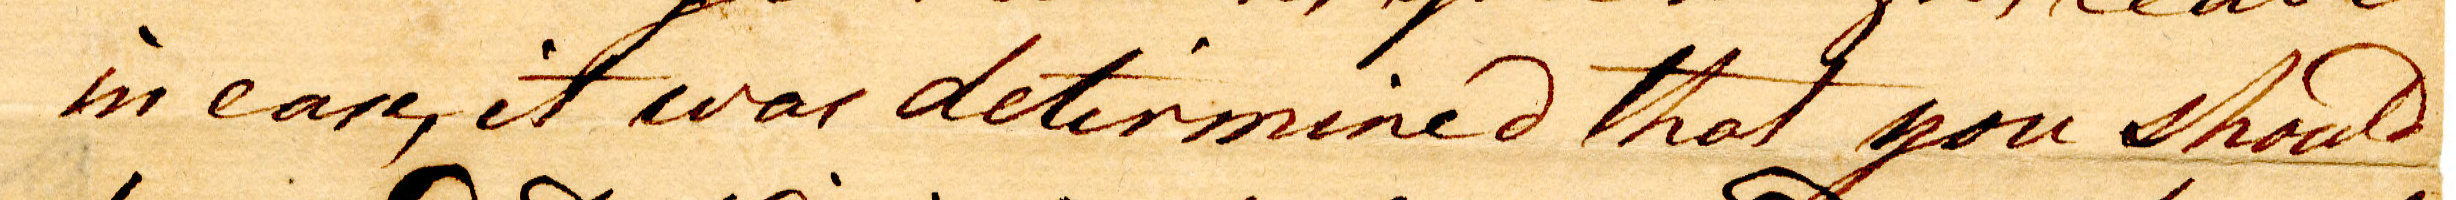in case it was determined that you should
